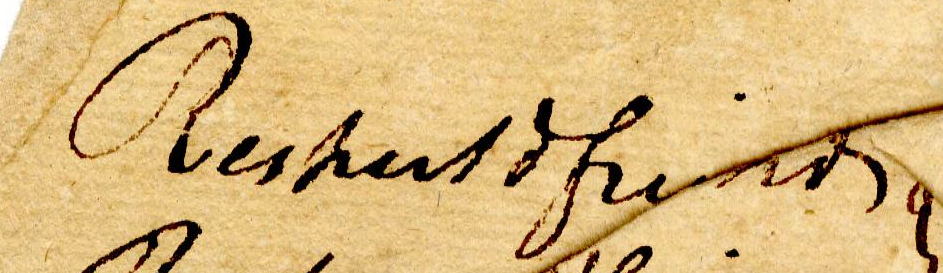Respectd friend
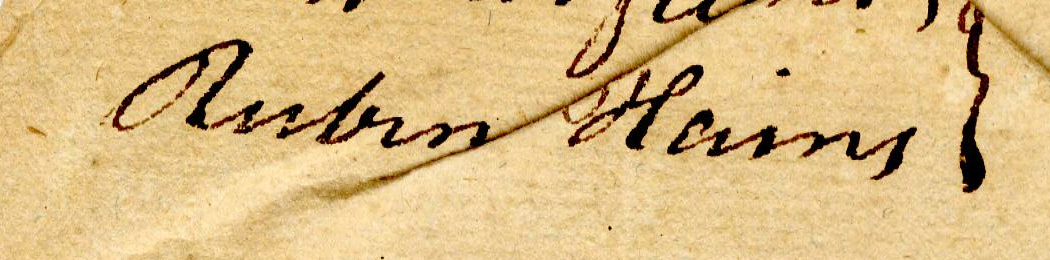Ruben Hains
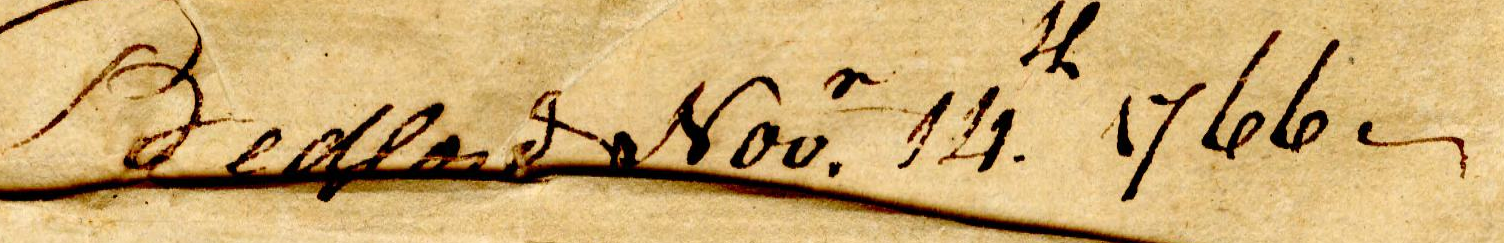Bedford Nov^r. 14^th. 1776
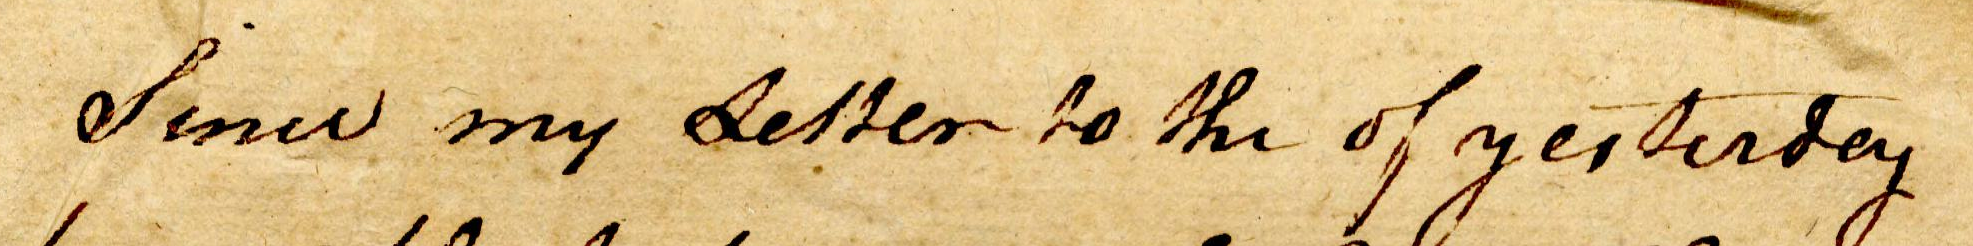Since my Letter to the of yesterday
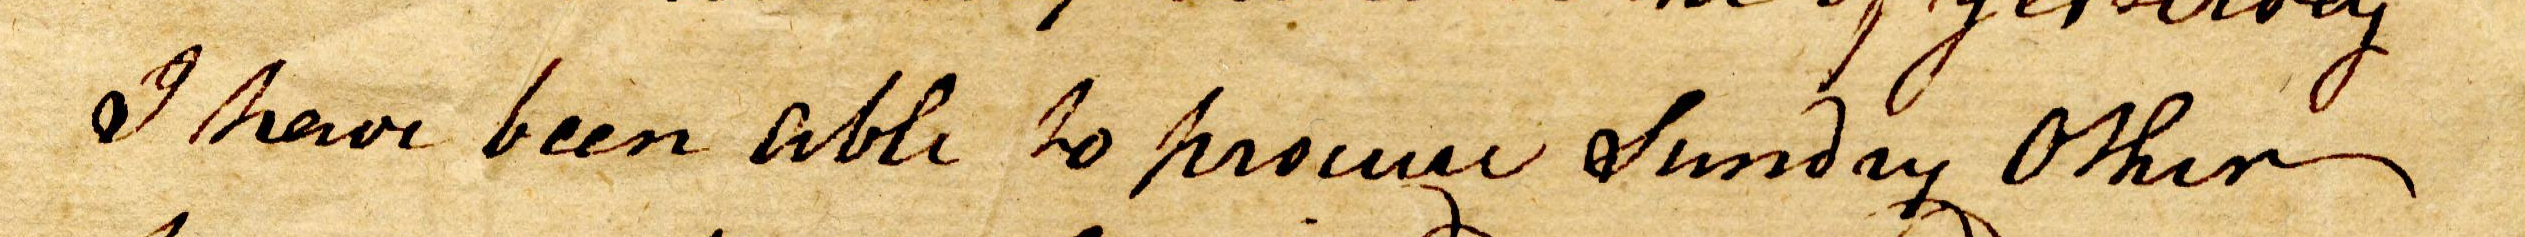I have been able to procure Sundry Other
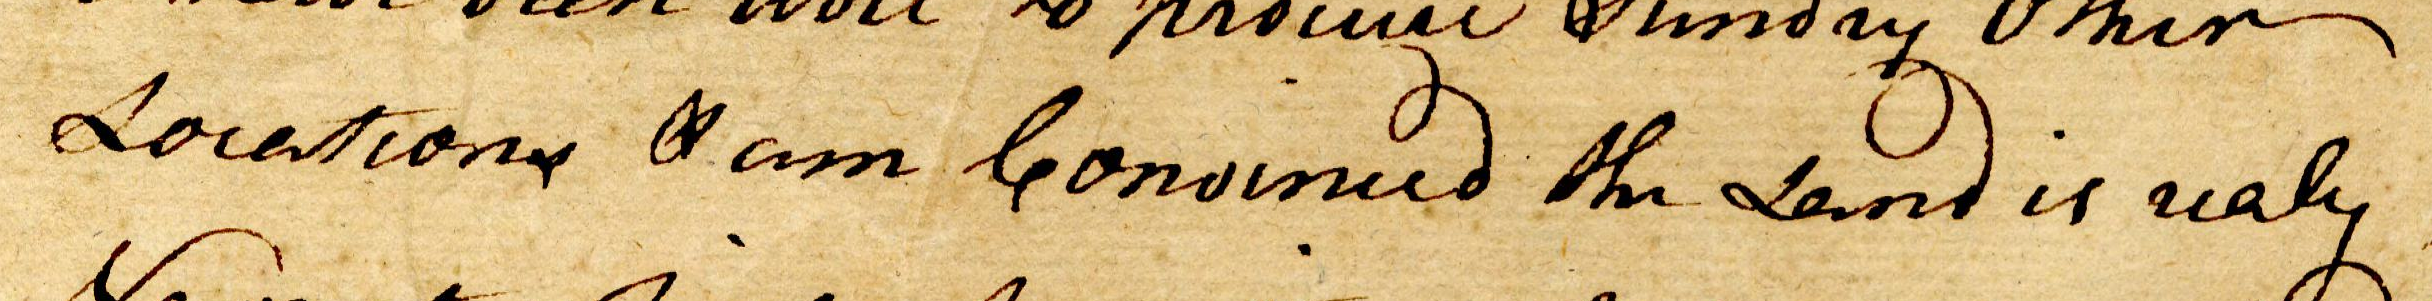Locations & am Convinced the Land is realy
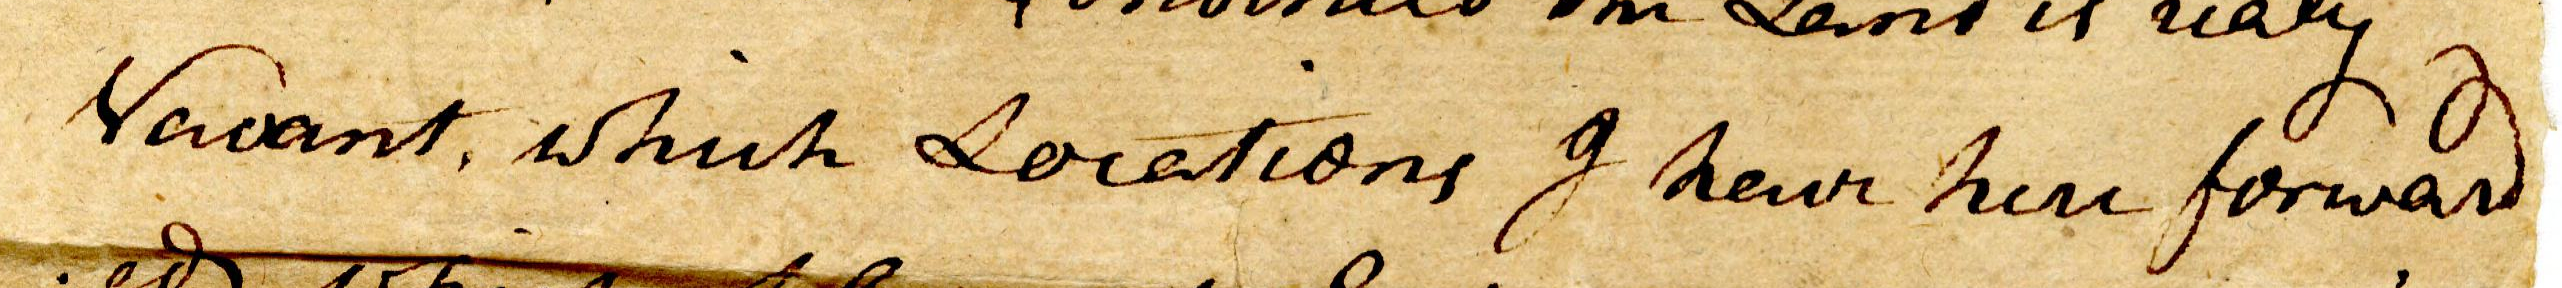Vacant, which Locations I have here forward
